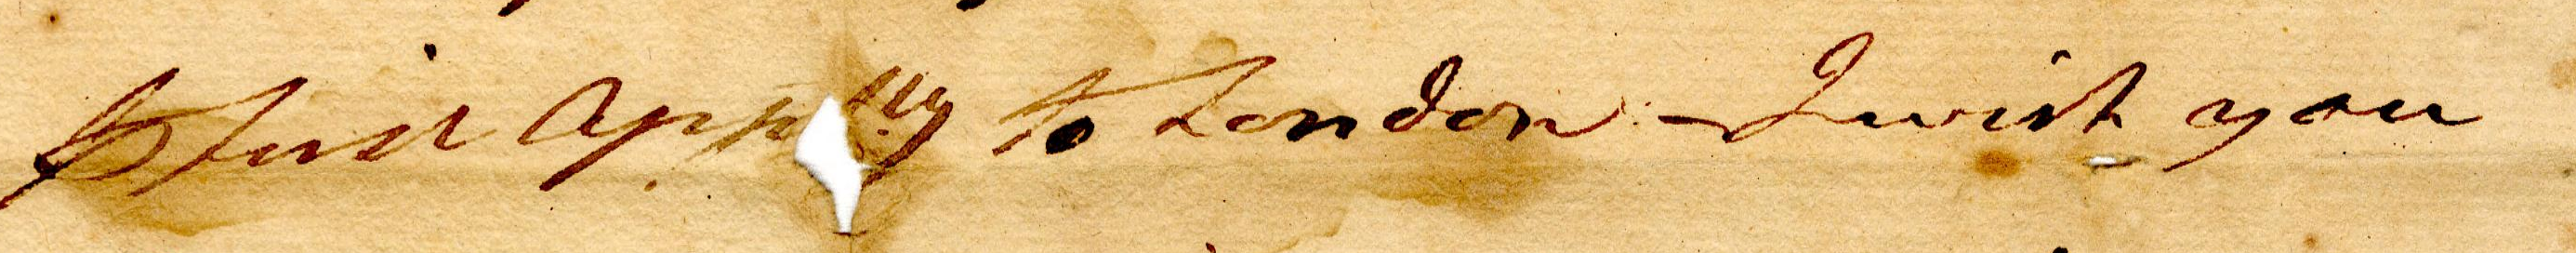per first opp^ty to London- I wish you
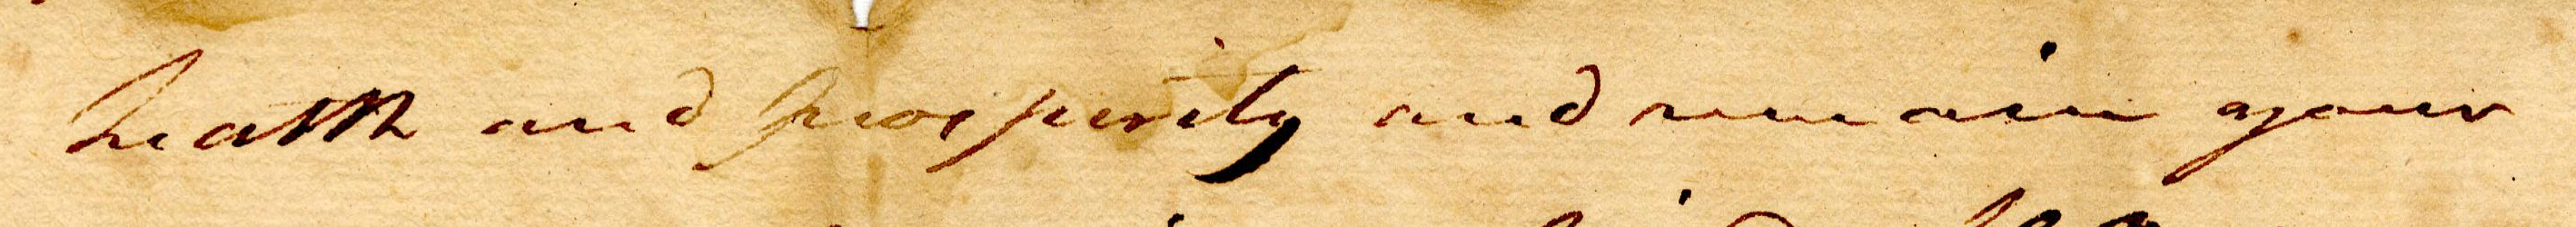health and prosperity and remain your
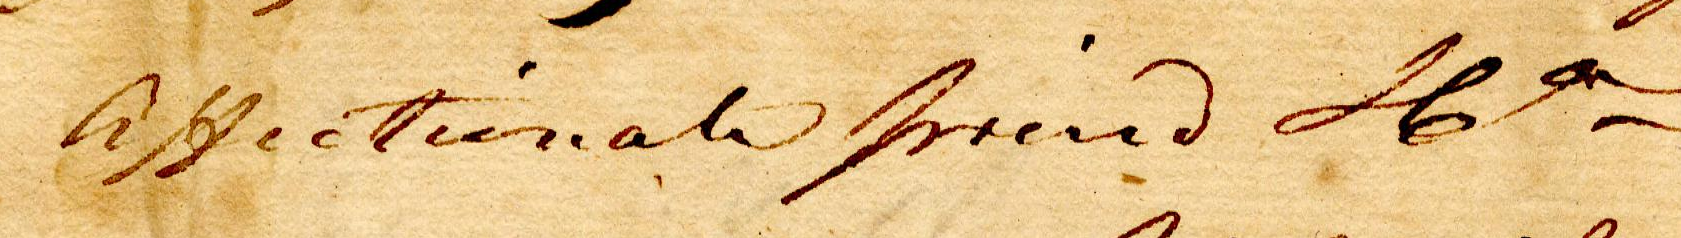Affectionate friend H^le
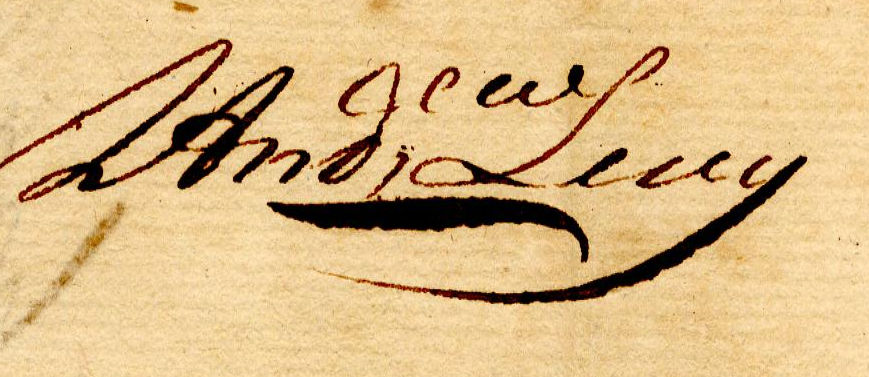And^rew Levy
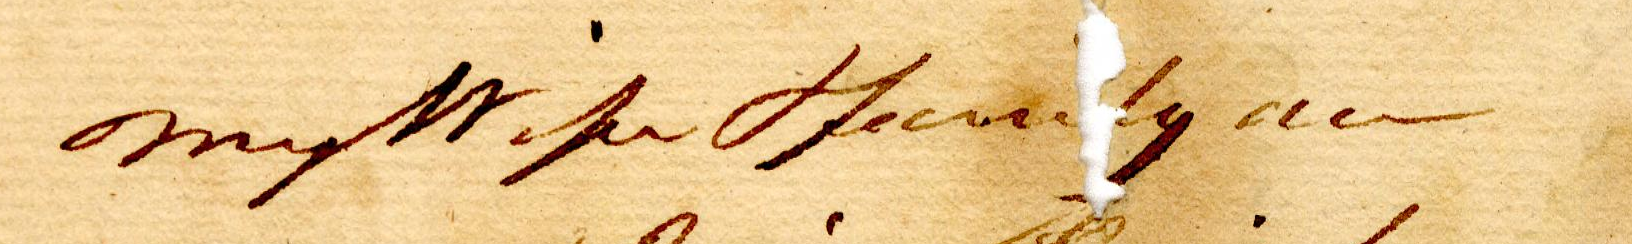My wife & family are
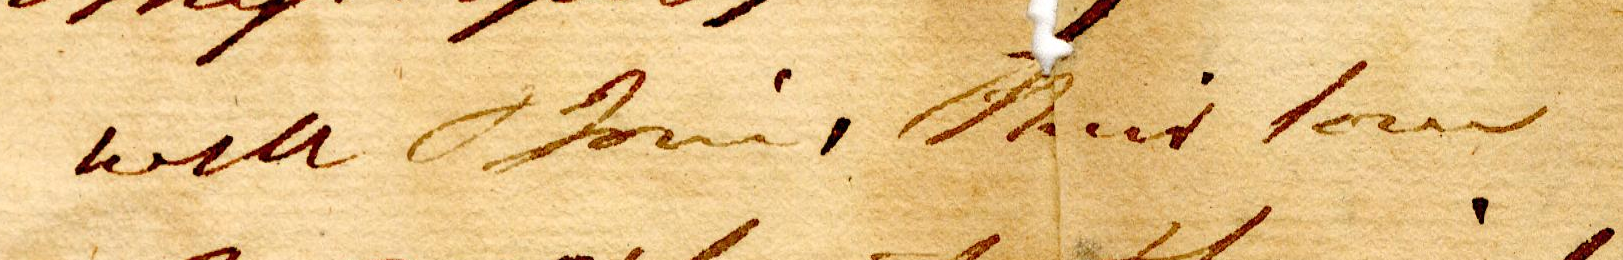well & Joyns their love
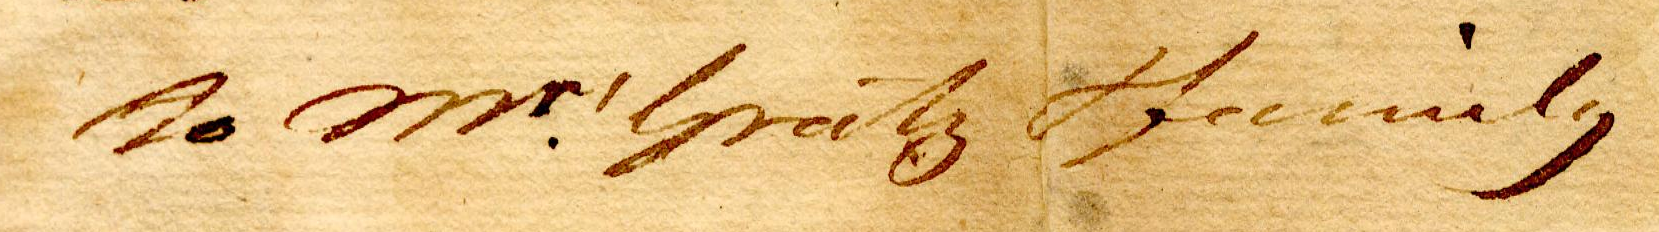to M^rs. Gratz & family
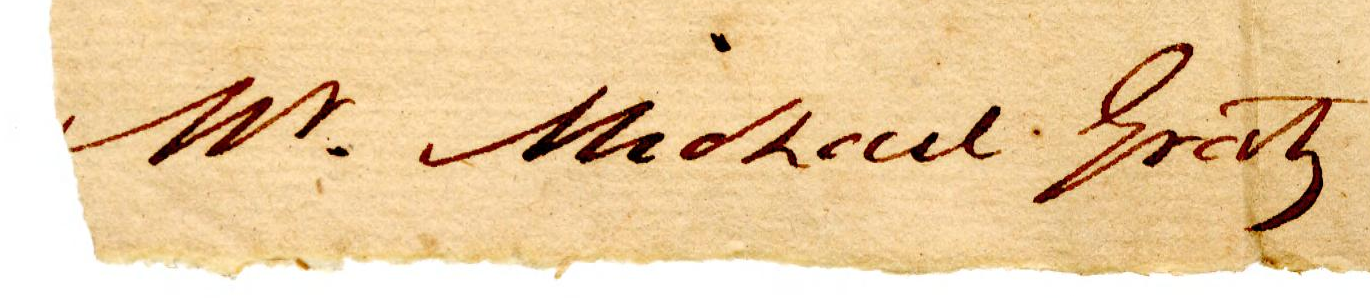M^r. Michael Gratz
